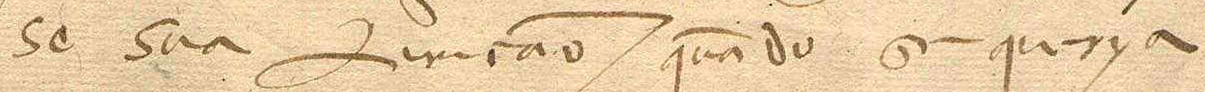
se sua temção q̄uado se querya
